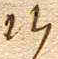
15
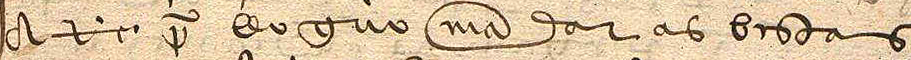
A Re p̄o lloguo mādar as bestas
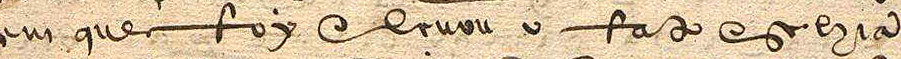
em que foy e leuou o fato e se hiā
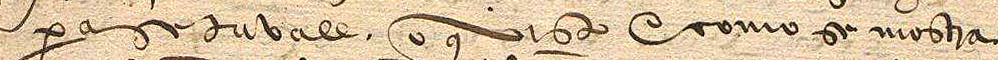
ꝑa setuvall. o q̄ visto e como se mostra
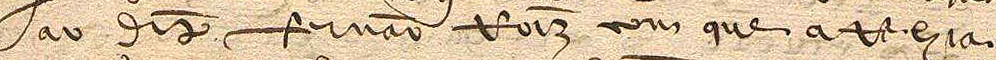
ao dito fernão Roīz com que a Re hia
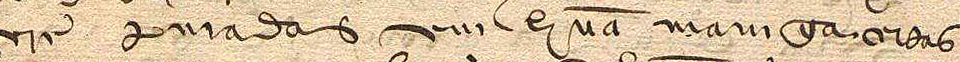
serē tomadas em hūa mamga certas
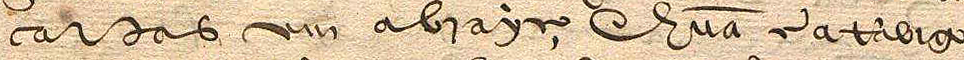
cartas em abrayco e hūa ē aRabigo
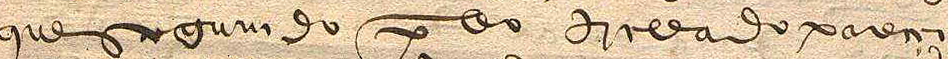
que segumdo p̄llo trellado parece
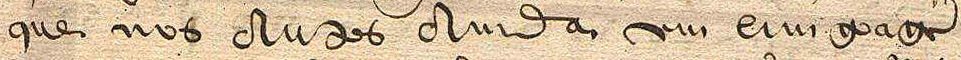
que nos Autos Amda em limgoagē
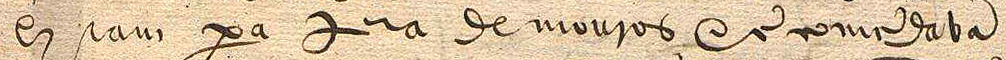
hiam ꝑa tera de mouros e ēcomēdavā
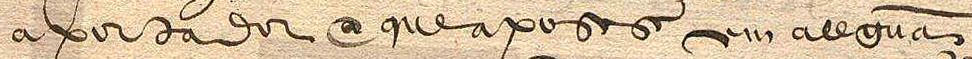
a portador a que a posesē em allgūa
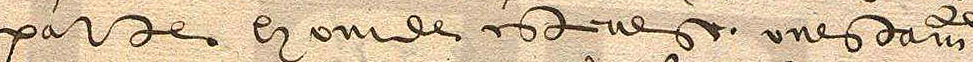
parte homde esteuese onestamte
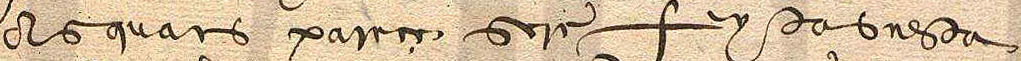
As quaes parece serē feytas nesta
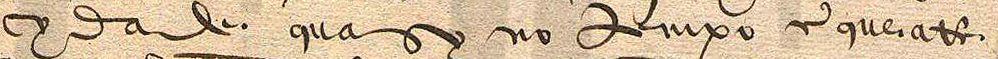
cydade. quasy no tempo ē que a Re
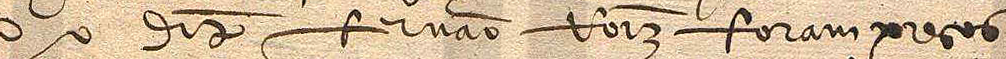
e o dito fernão Roīz foram presos
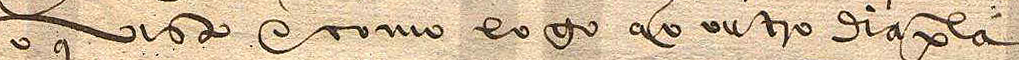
o q̄ visto e como logo ao outro dia p̄la
